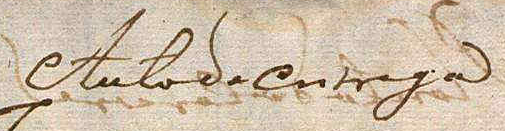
Auto da entrega
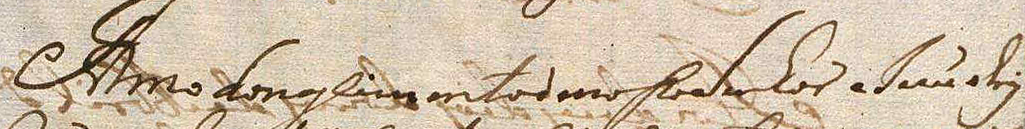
Anno do nasCimento do nosso Senhor e Iesū chris
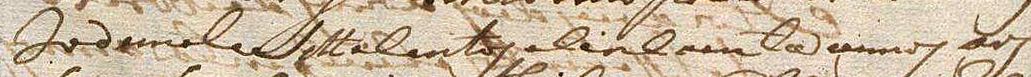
to de mil e SetteCentos e CinCoenta annos aos
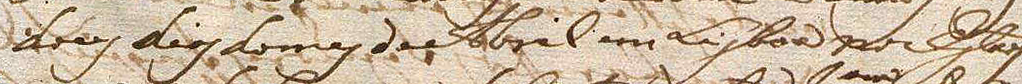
dous dias do mes de Abril em Lisboa nos Estaos
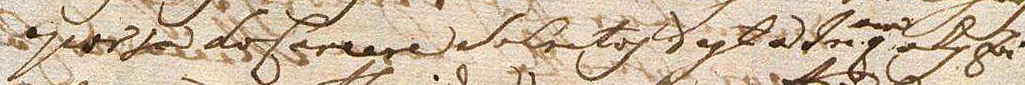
e porta do Carcere SeCretos desta In.qam ahy foi
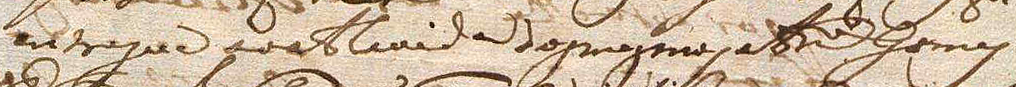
entregue ao Alcaide dos mesmos Anto Gomes
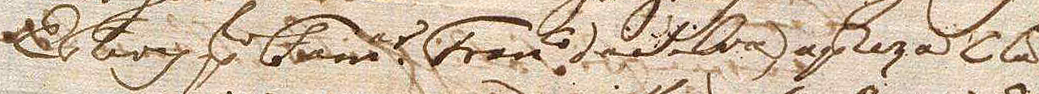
Esteves plo Fam.ar Fran.co da silva, a preza, Cla
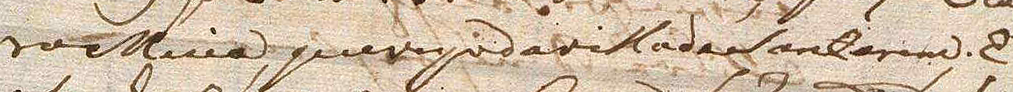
ra Maria, que veyo da villa da Santarem. E
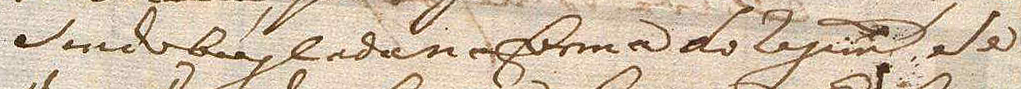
Sendo busCada na forma do Regim.to Se
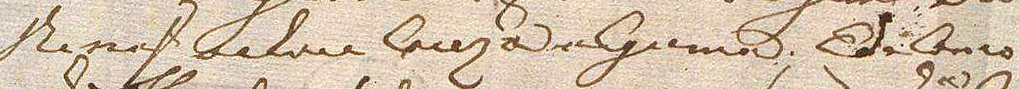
lhe naõ achou Cauza alguma. E de Como
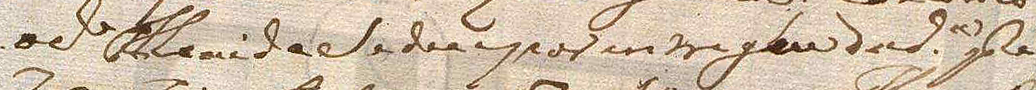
o do Alcaide Se deu por entregeu da d.a pre
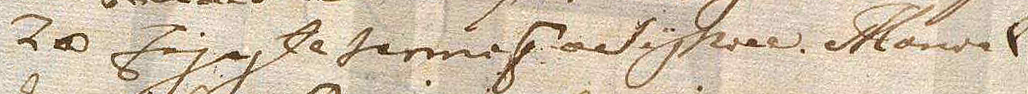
Za fis este termo q̄ aSignou. Manoel
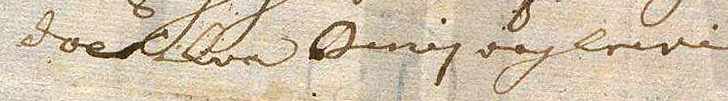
da Silva Denis o escrevi
